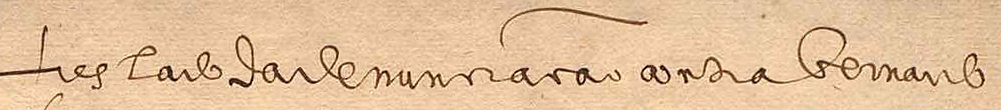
treslado da denunciação contra bernando
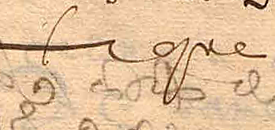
fique
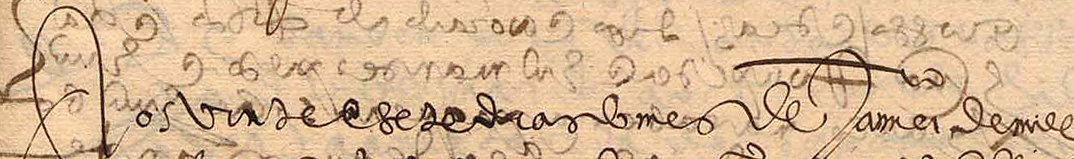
Aos vinte e sete dias do mes de Janneiro de mill
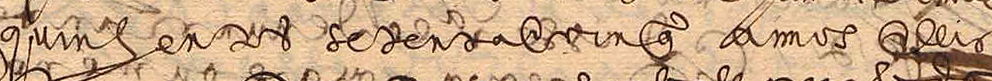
quinhentos setenta e cinq̄o annos ē llis
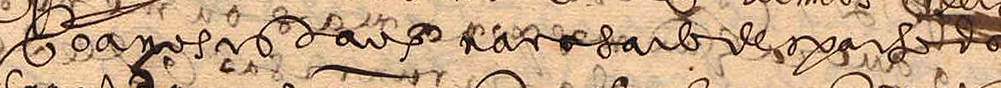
boa nos estaos na casa do despacho da
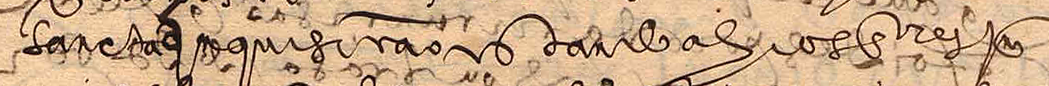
sancta Jnquisiçaõ estando ahi os sores Jm
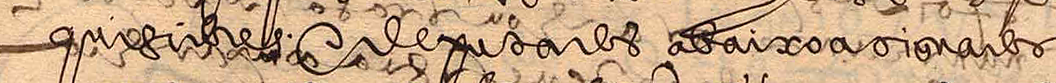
quisidores e deputados abaixo asignados
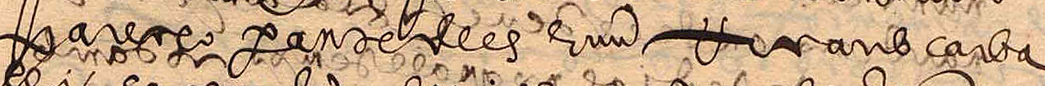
pareceo ꝑante elles huū Ricardo carba
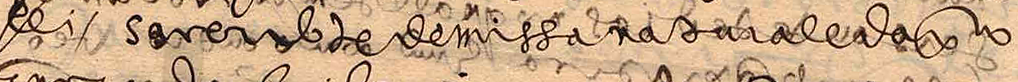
lli / sacerdote de missa naturall da pro
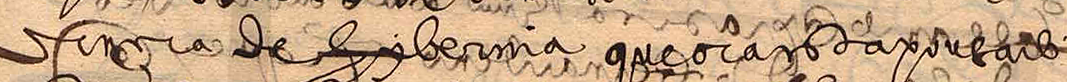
vincia de hybernia que ora esta pousado
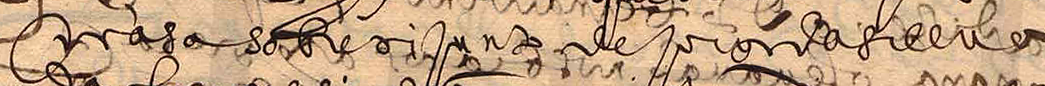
ē casa sobre si Junto de Jorge da sillua
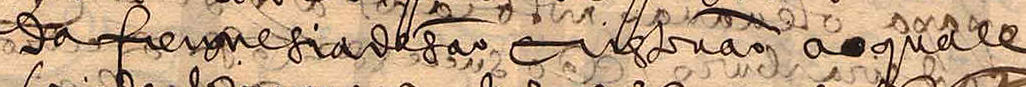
da freiguesia da são Cristouão ao quall
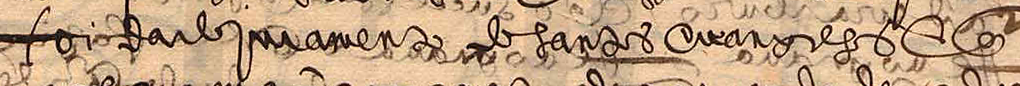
foi dado juramento do santos euangelhos ē q̄
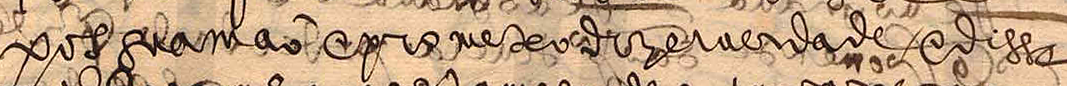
pos sua maõ e prometeo dizer uerdade / e disse
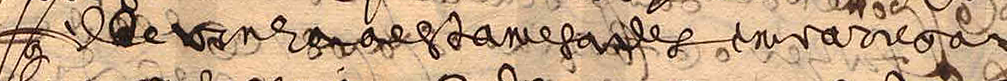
q̄ ele vinha a esta mesa desemcarregar
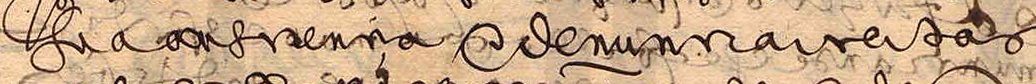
sua consciencia e denunciar certas
